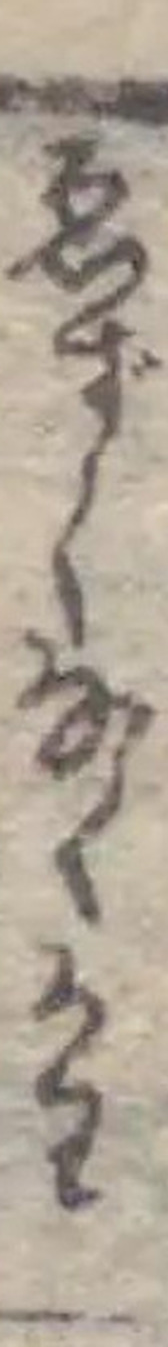ゑづくなくかわ
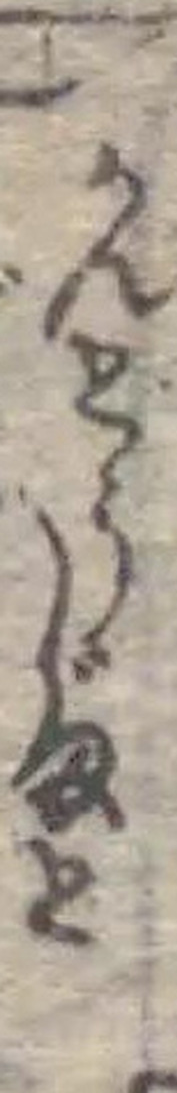かんとうじまと
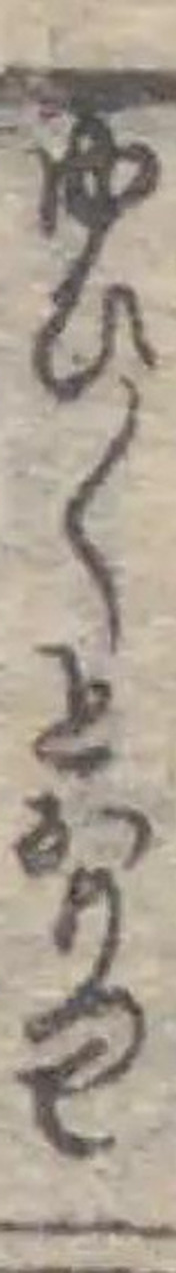ゆひ〳〵とおもつて
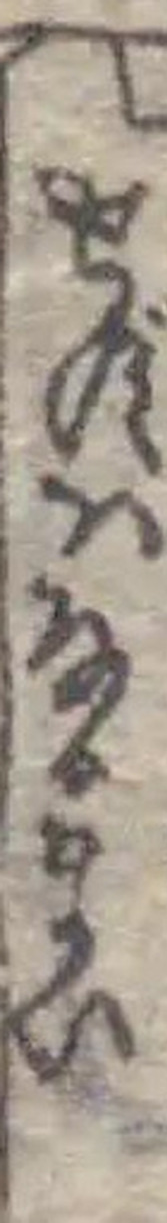せずはなるまい
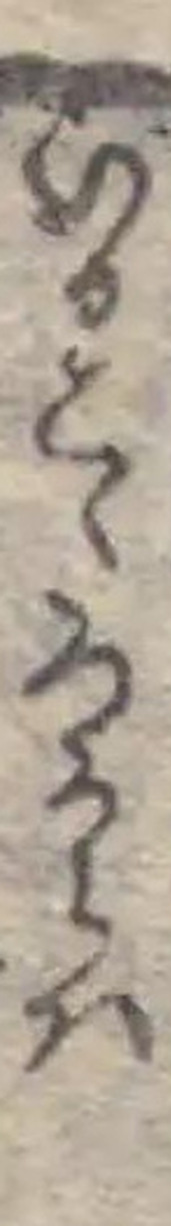いるこゝろからは
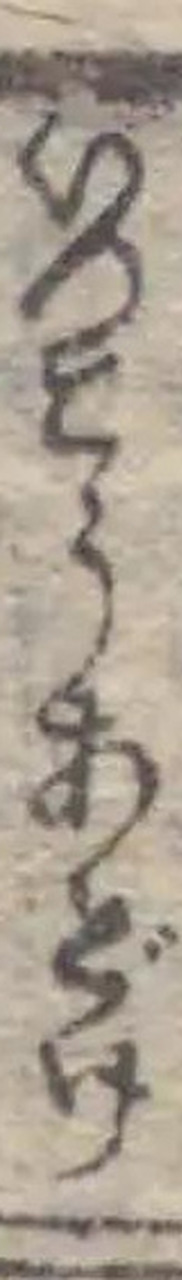いつこうあどけ
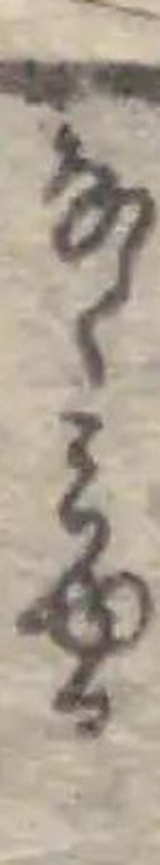なくみゆる
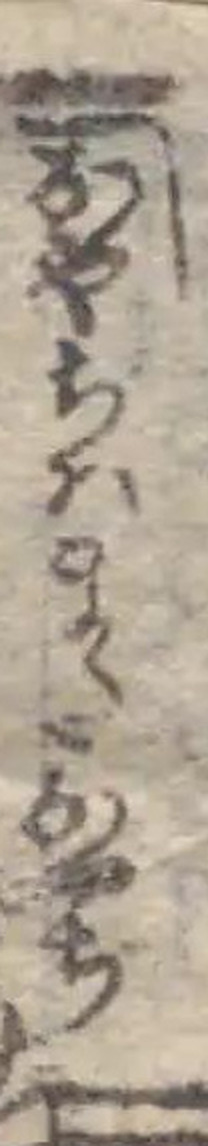〽おやちはまたいやぢ
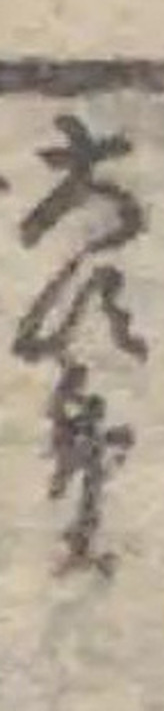大次郎か
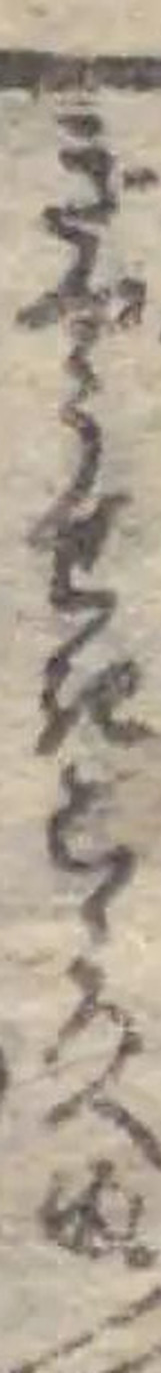ぎやうせきこゝろへぬ
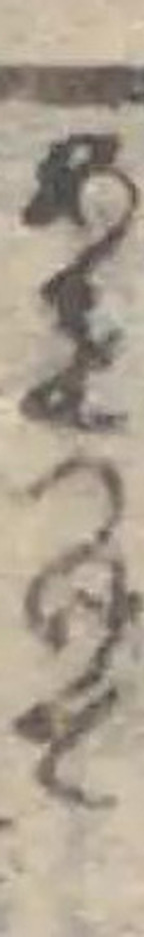めをつけて
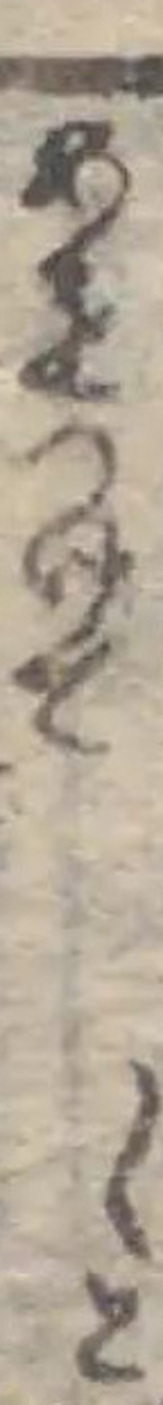めをつけて
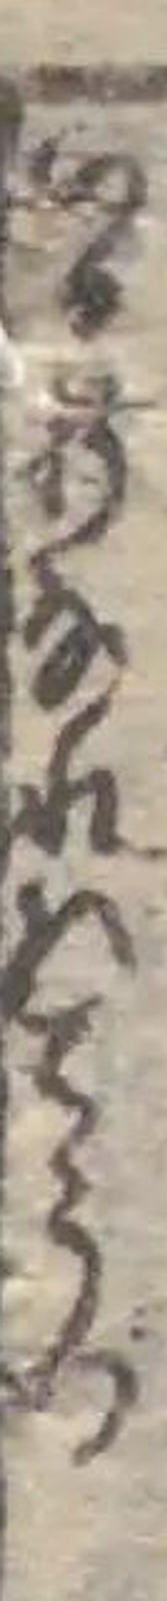いる折りなれはてうづ
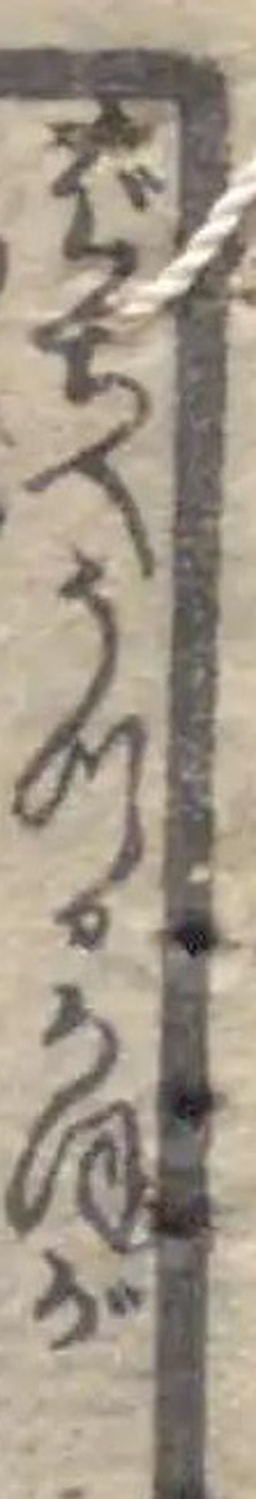ばちへうつるかほが
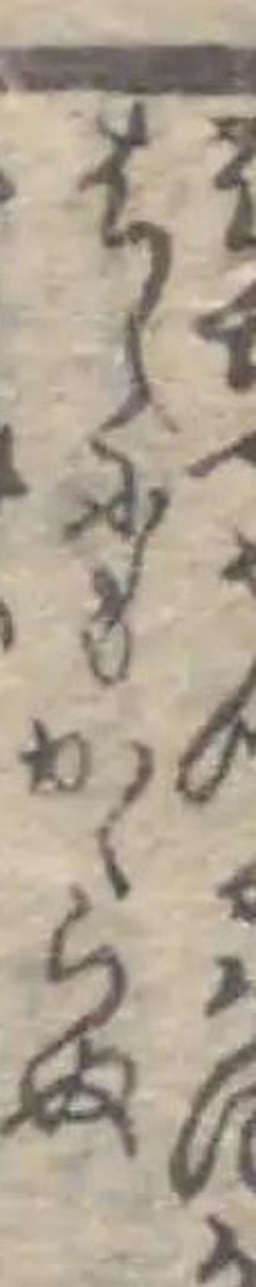はしにもかゝらぬ
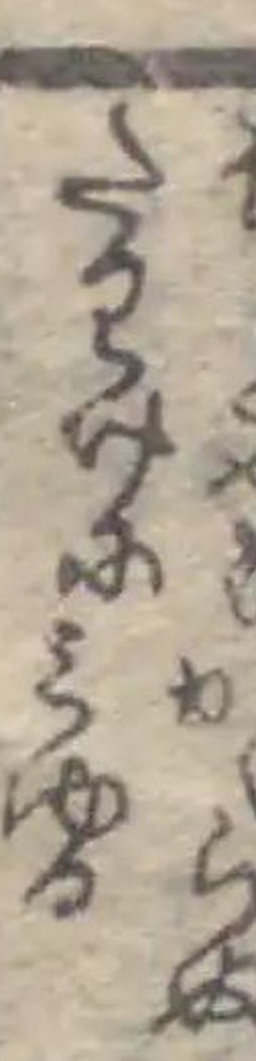たわけにみゆる
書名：福壽海旡量品玉 3巻
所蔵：国立国会図書館 National Diet Library, JAPAN
